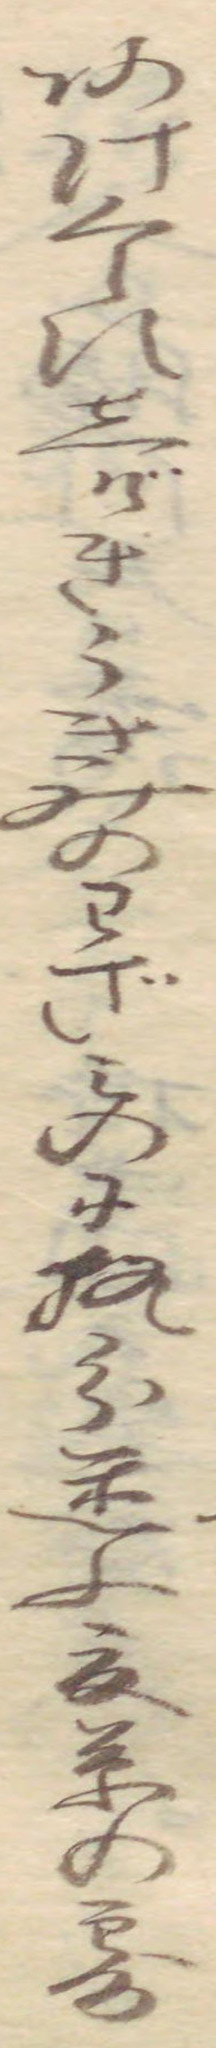あけくらすしげきうきみのわざみのに猶分迷ふ夏草の露
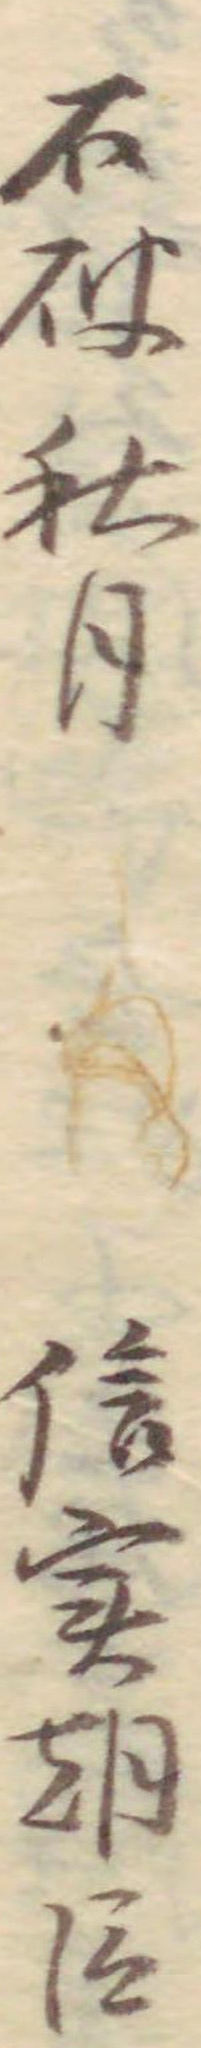不破秋月信実朝臣
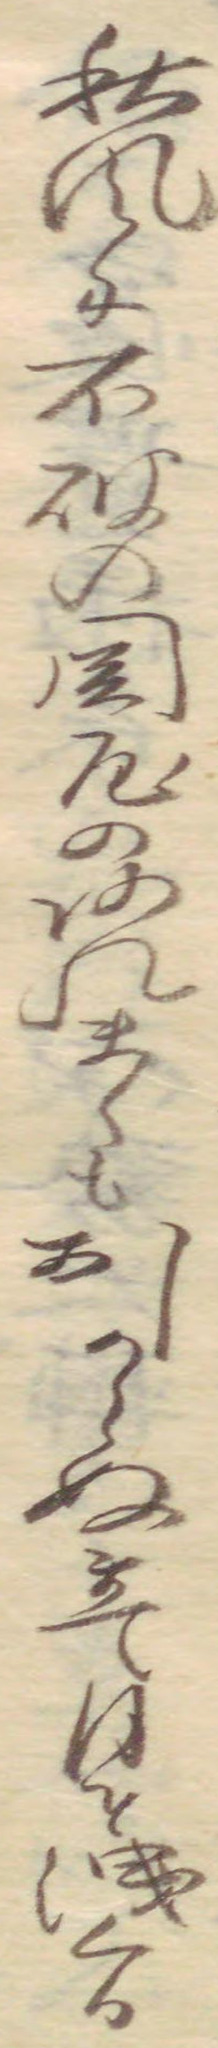秋風に不破の関屋のあれまくもおしからぬまて月を洩くる

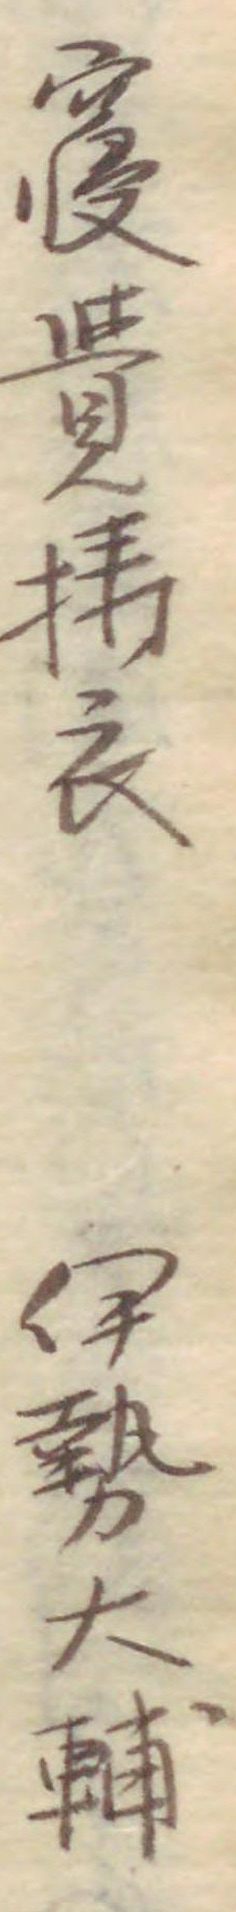寝覚擣衣伊勢大輔
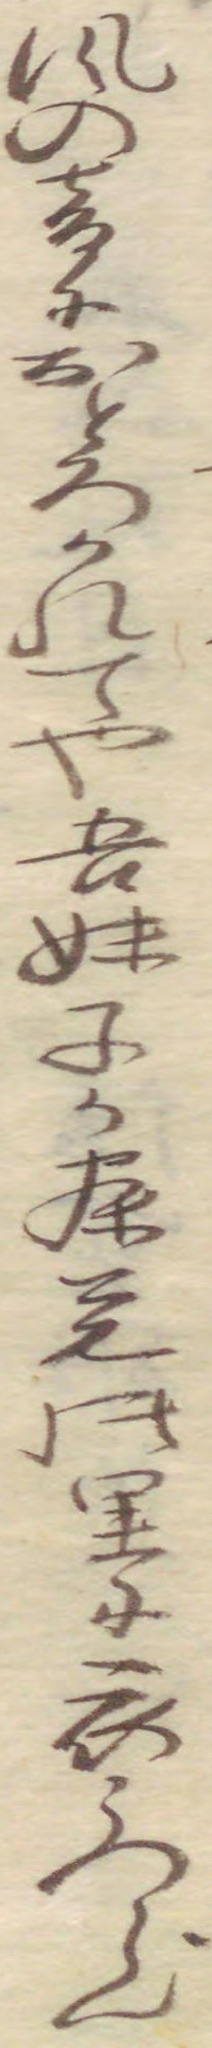風の音におとろかれてや吾妹子か寝覚の里に衣うつらん
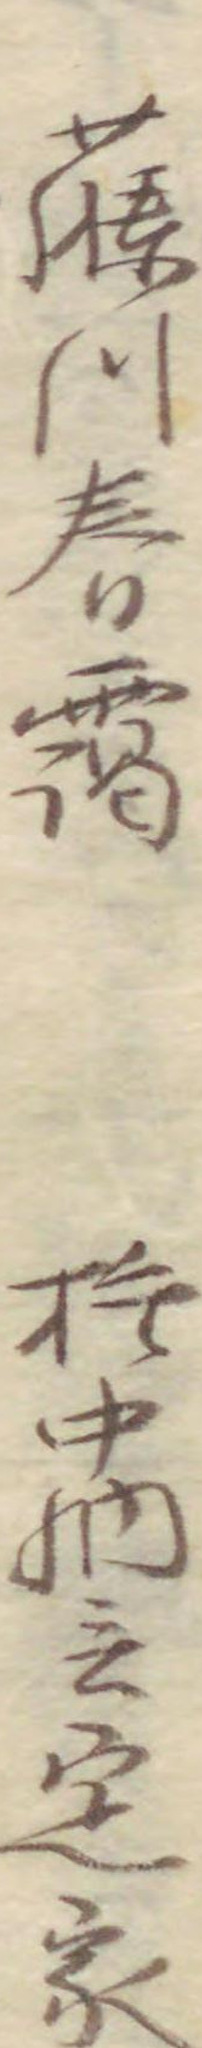藤川春靄権中納言定家
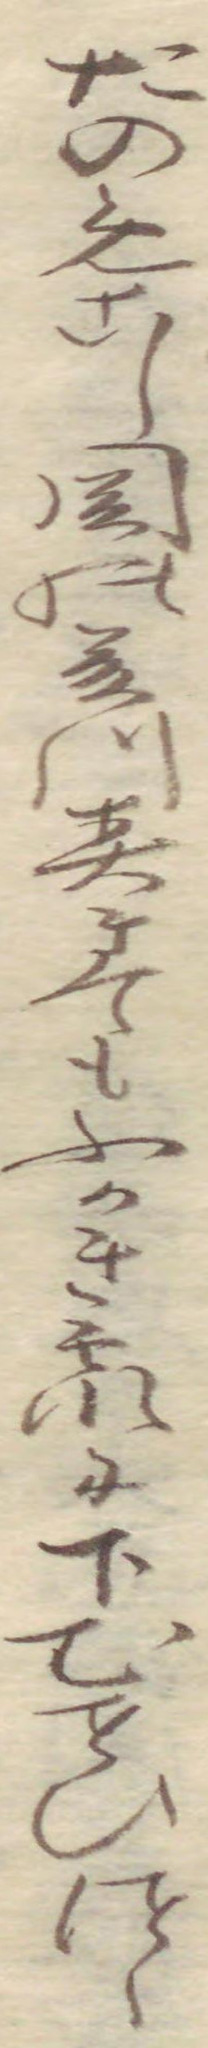たのめこし関の藤川春きてもふかき霞に下むせひつゝ
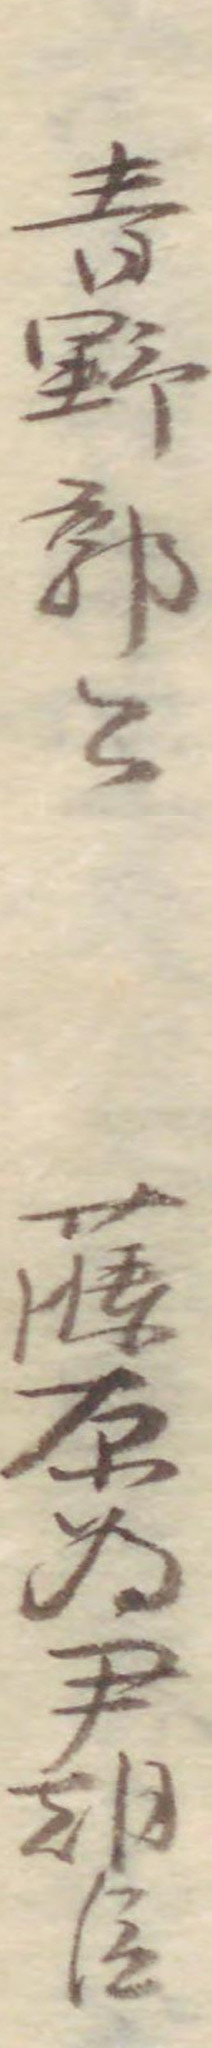青野郭公藤原為尹朝臣
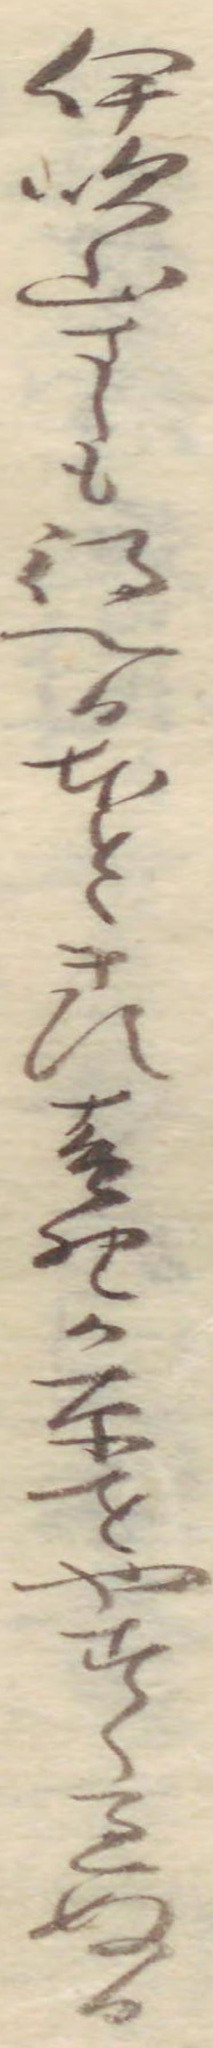伊吹山さしも待へるほとゝきす青野か原をやすく過ぬる
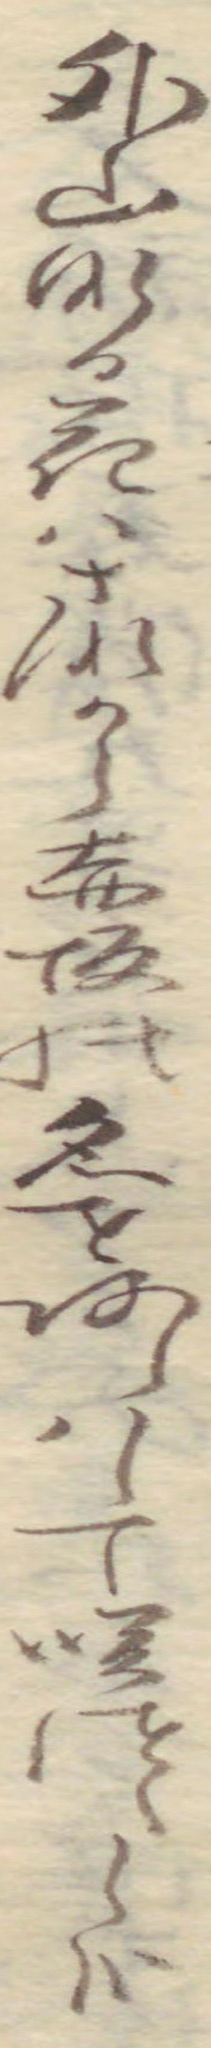外山なる花はさなから赤坂の名をあらはして咲つゝし哉
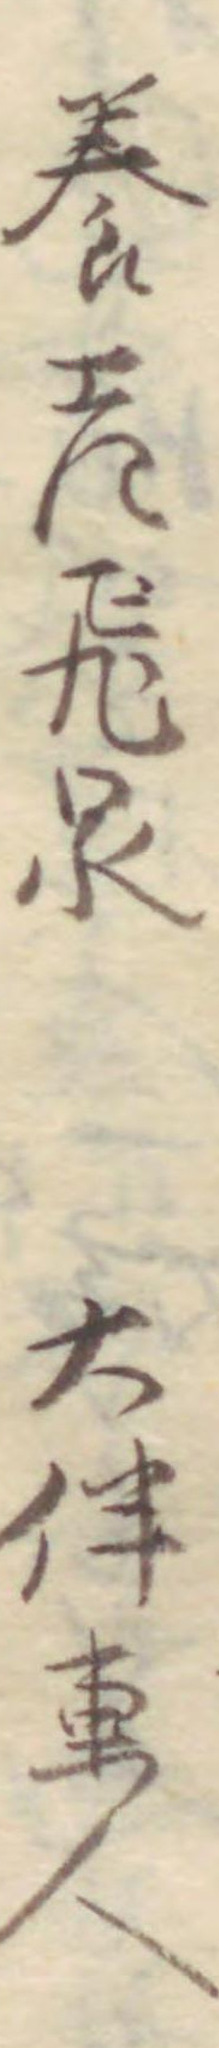養老飛泉大伴東人
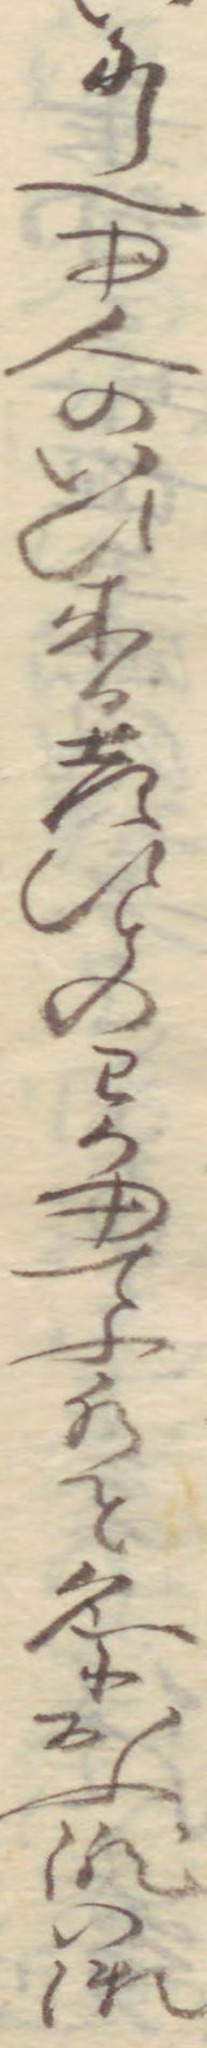いにしへゆ人のいひ来る老ひとのわかゆてふ水そ名におふ瀧の瀬
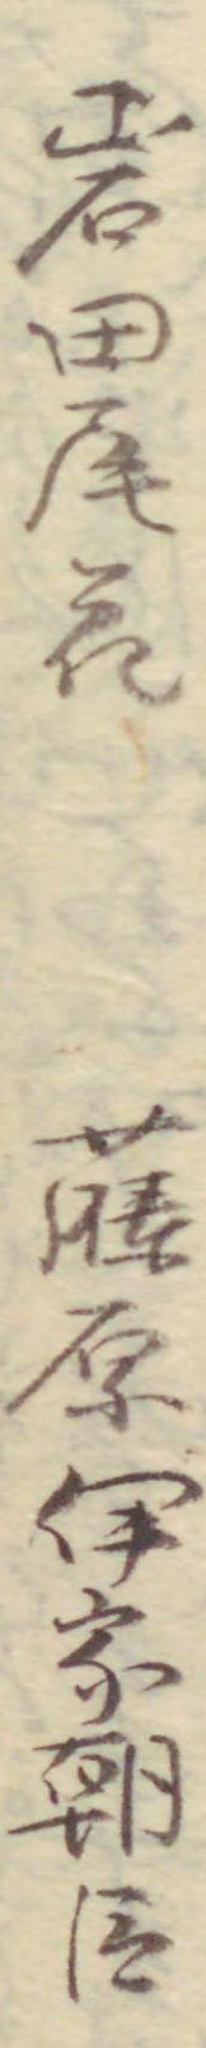岩田尾花藤原伊家朝臣
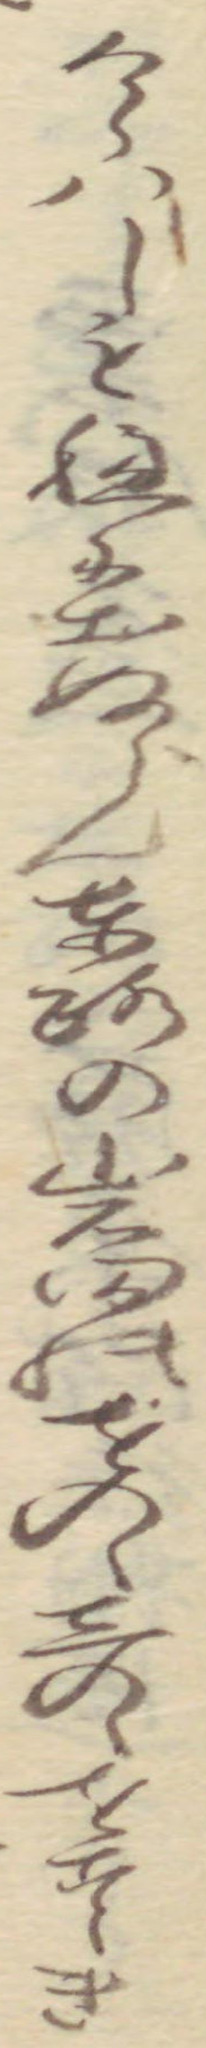今はしも移？に出ぬらん東路の岩田のをのゝしのゝをすゝき
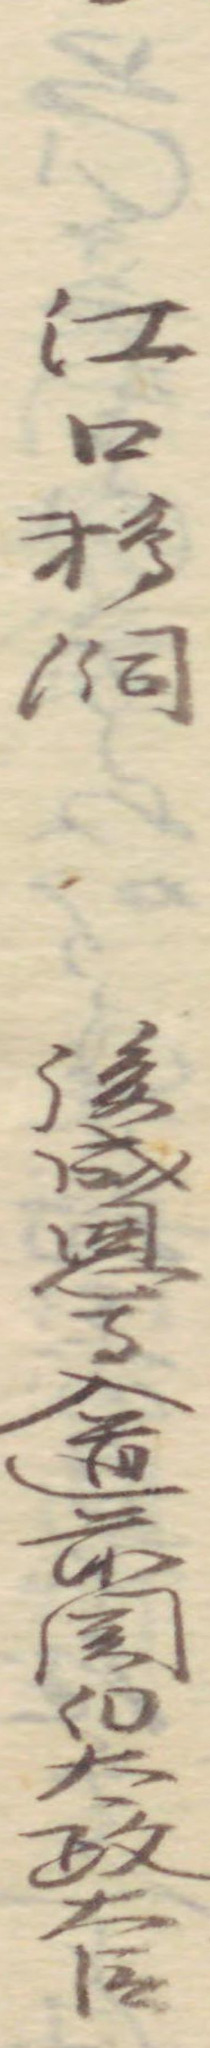又江口鵜飼後成恩寺入道前関白太政大臣
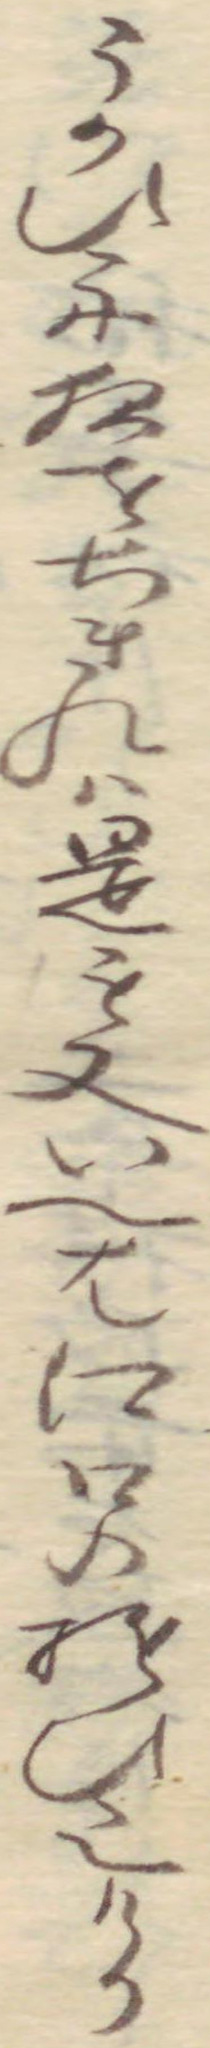うかひ舟夜をちきれは是も又いへは江口の遊ひ也けり
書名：鶯宿雑記. 巻263-264
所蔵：国立国会図書館 National Diet Library, JAPAN
